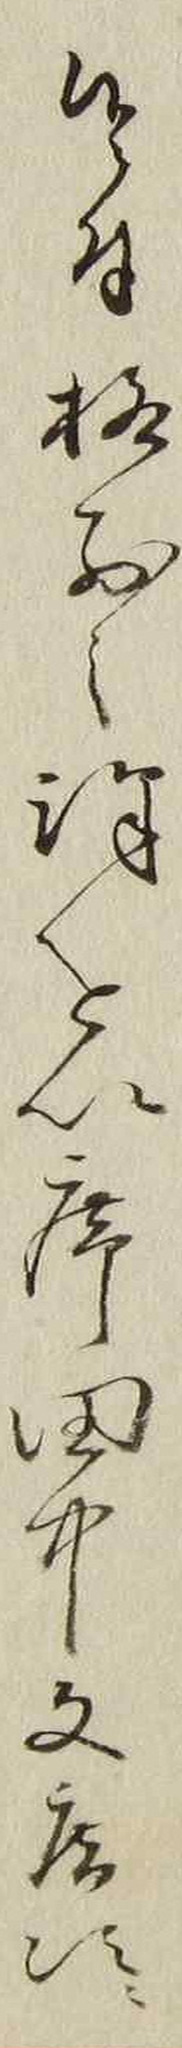候ニ付格別之訳を以席田中文庵次ニ
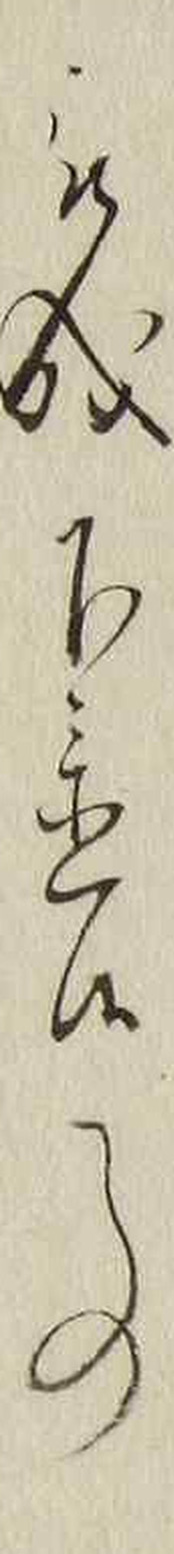被成下置候事
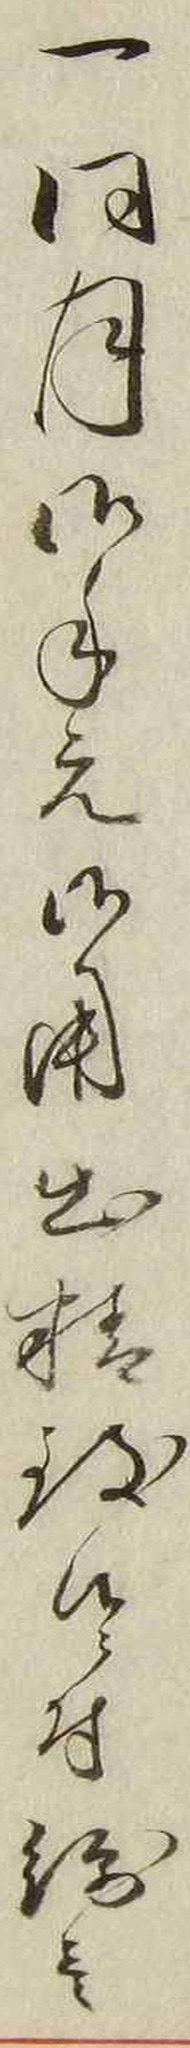一同月御手元御用出精致候ニ付綿壱
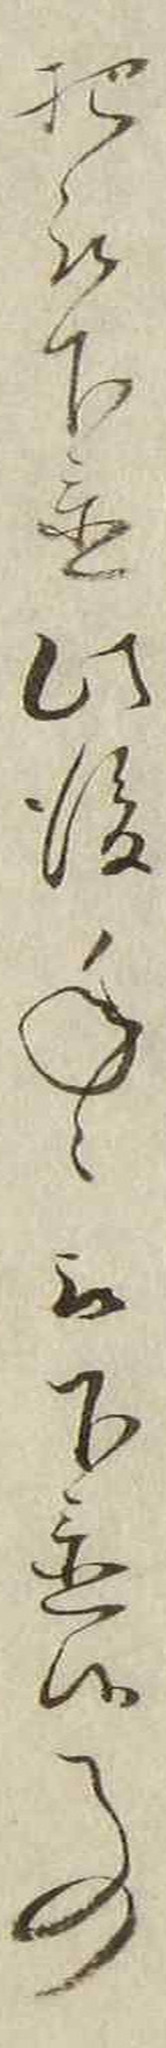把被下置此後年々被下置候事

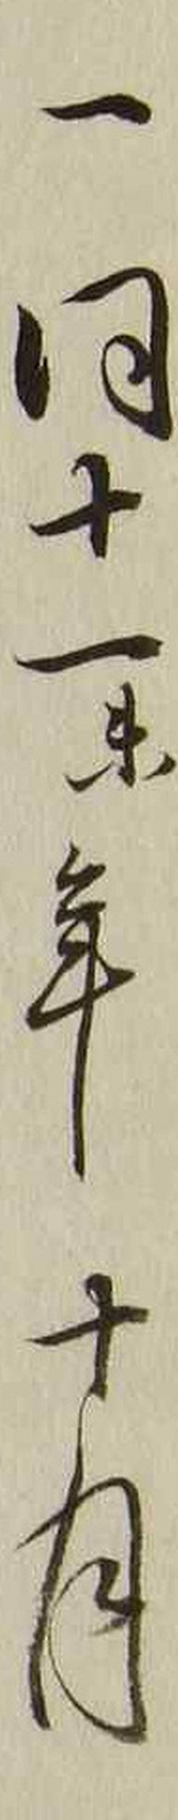同十一未年十月
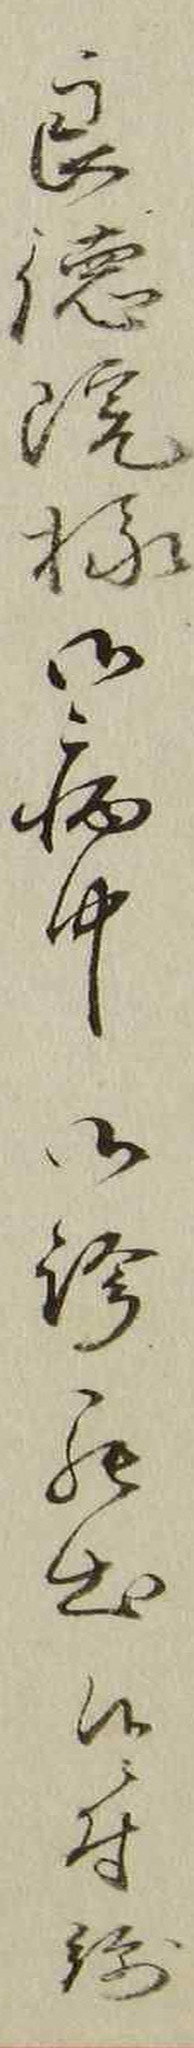良徳院様御病中御診罷出候ニ付綿
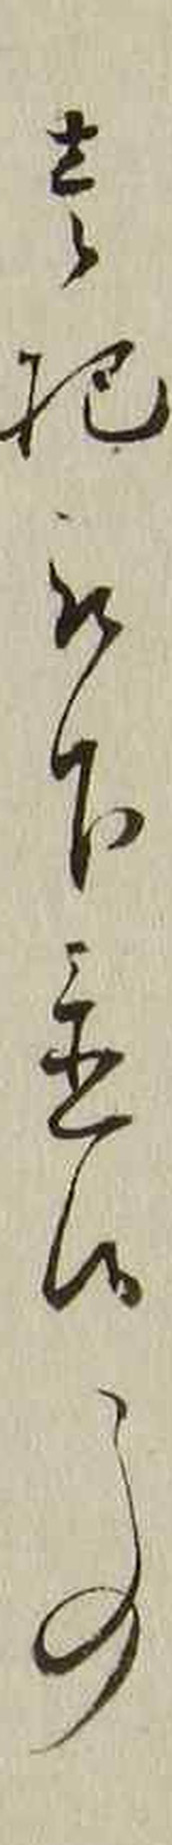壱把被下置候事
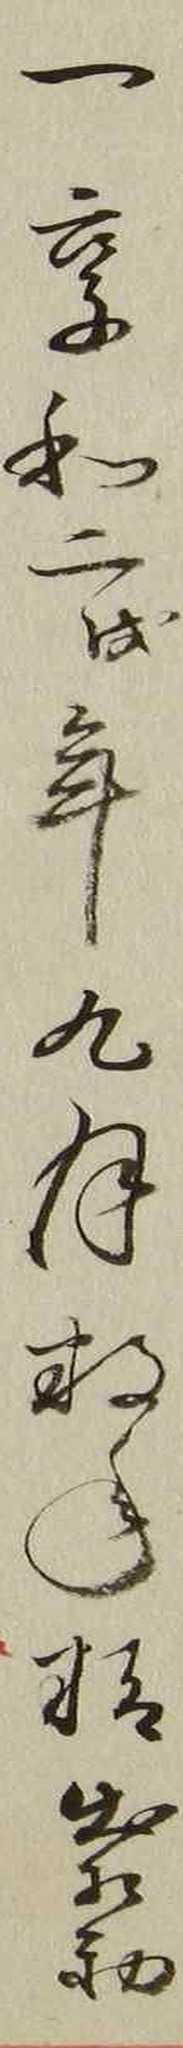一享和二戌年九月数年精出相勤
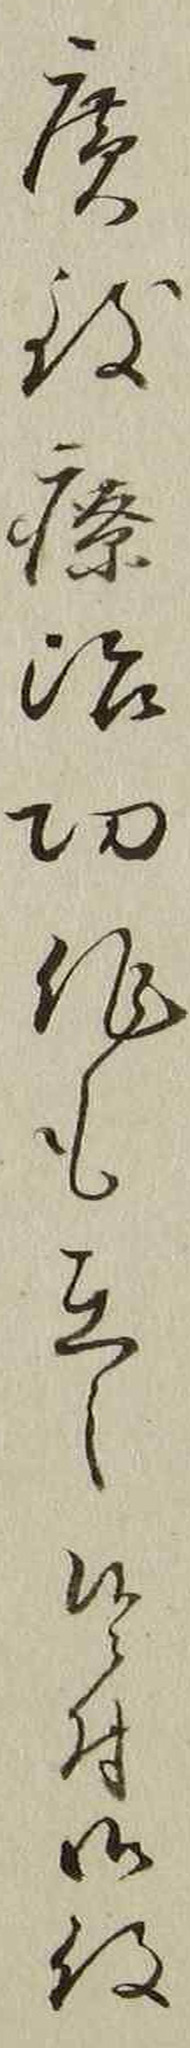広致療治切作も在之候ニ付御役
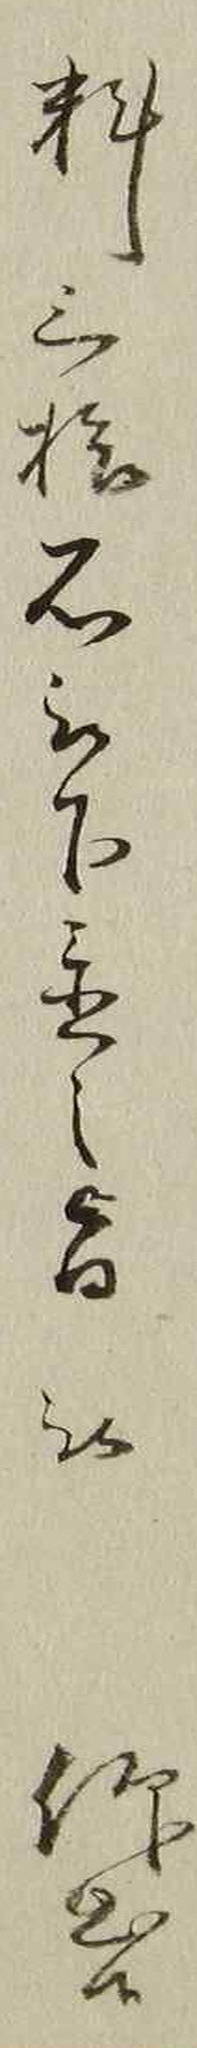料三拾石被下置之旨被仰出候
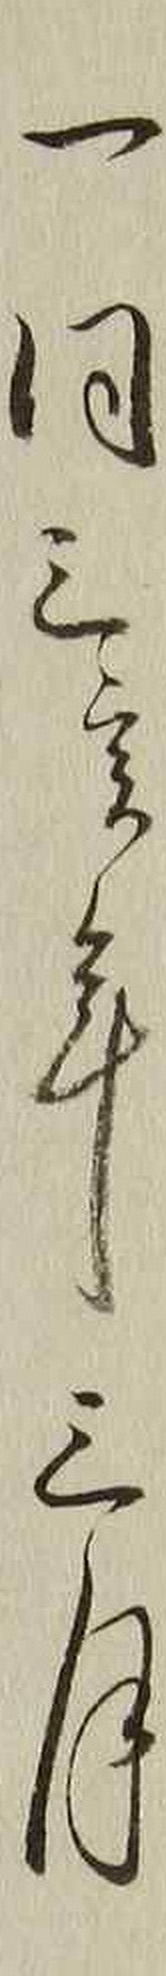一同三亥年三月
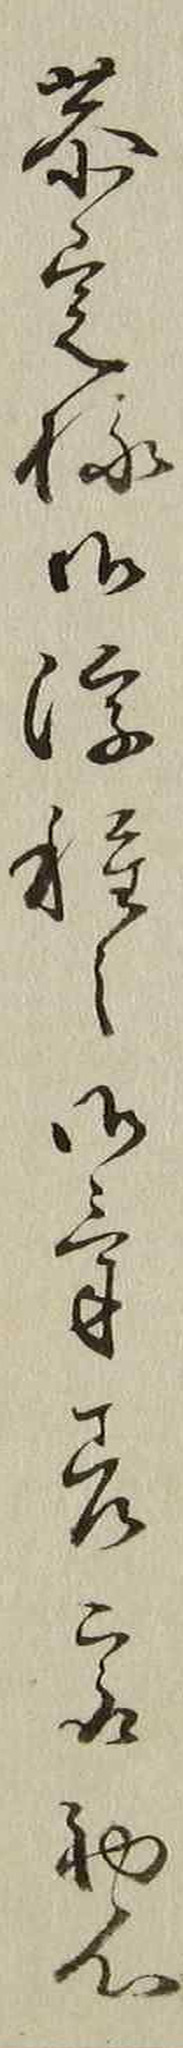恭定様浮種之御気差最初心
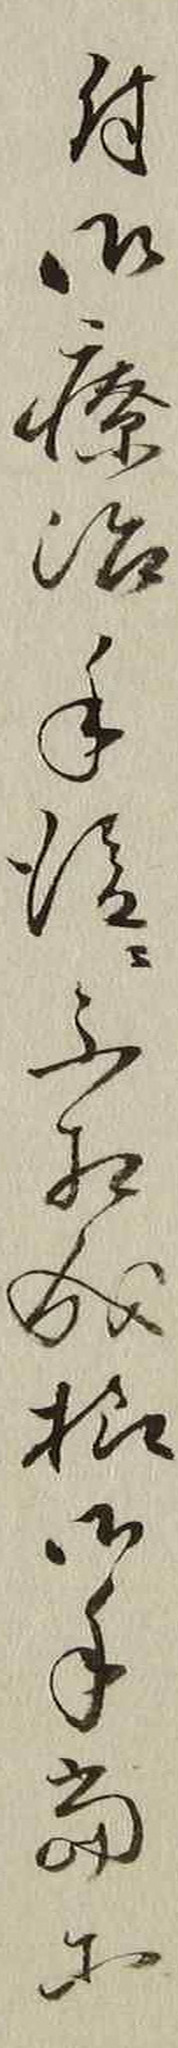付御療治手後ニ不相成様御手当等
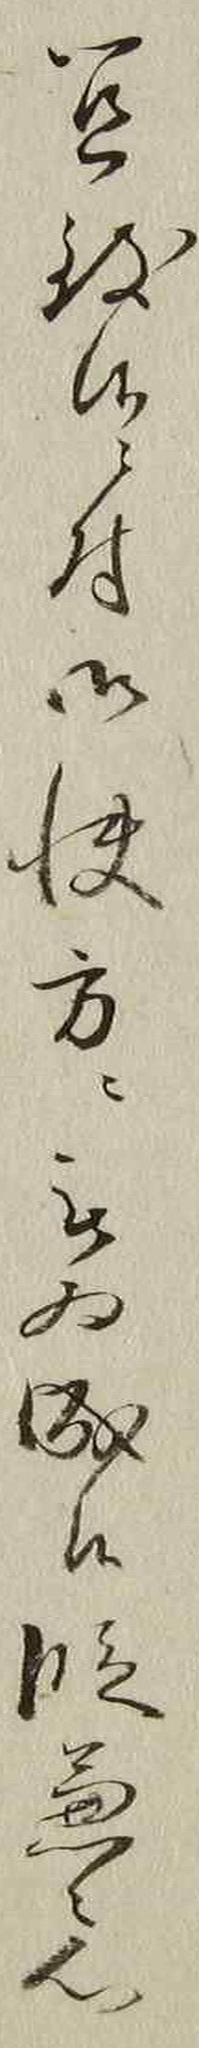宜致候ニ付御快方ニ被為成候段兼々心
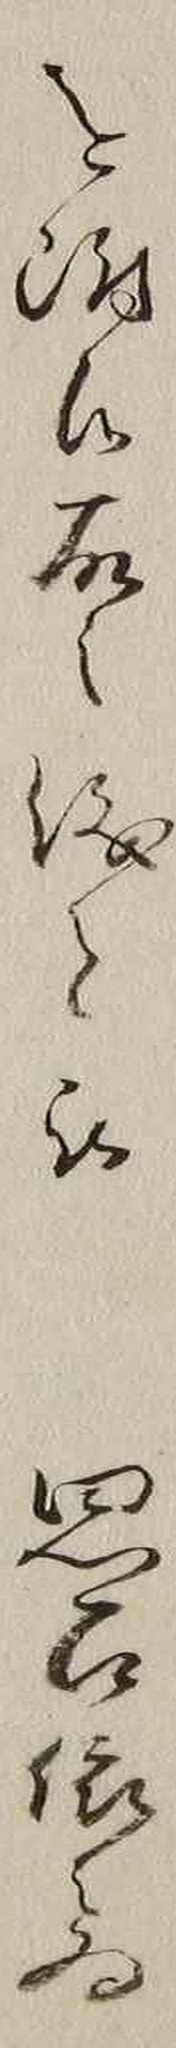を付候故之儀と被思召依之為
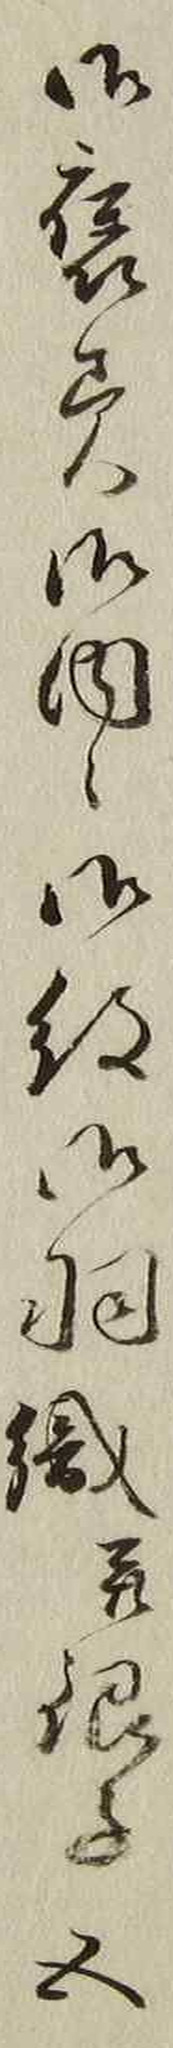御褒美御内々御紋御羽織并銀子五
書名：諸士系譜　巻之8　い之部8
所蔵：会津若松市立会津図書館
